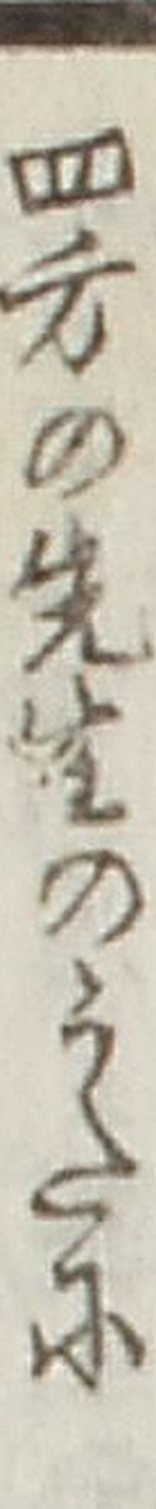四方の先生のうたに
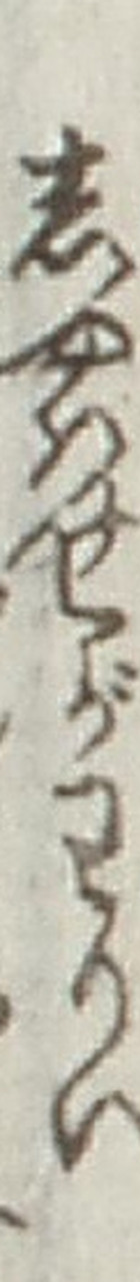しやはせがわり？い
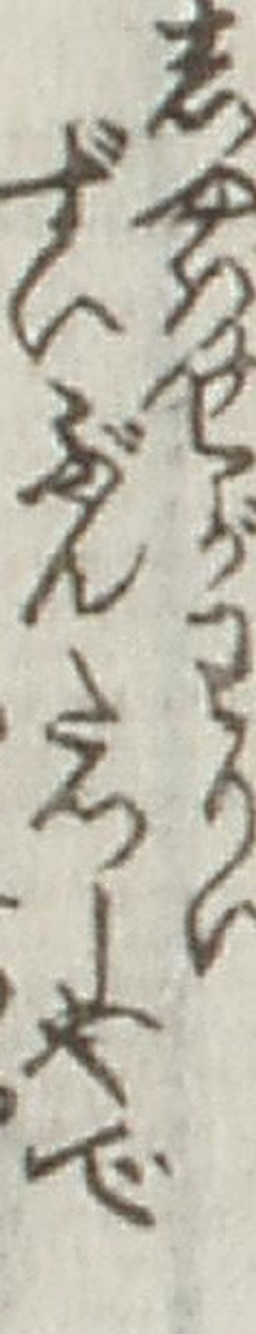ずいぶんたつしやで
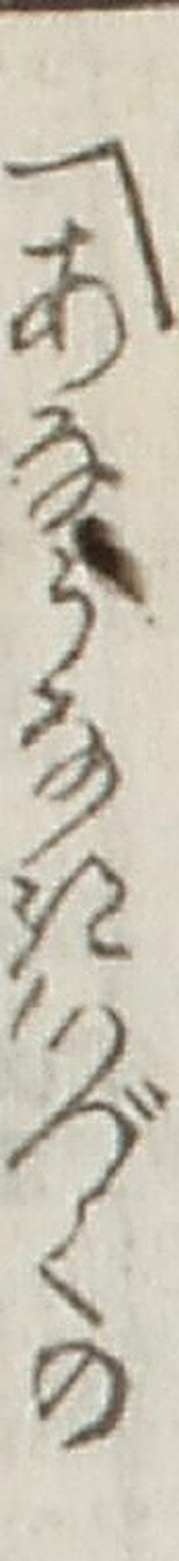〽あなうなきいづくの
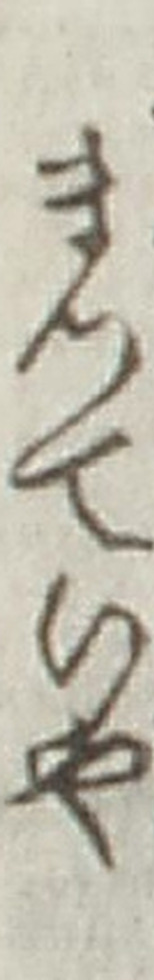まつていや
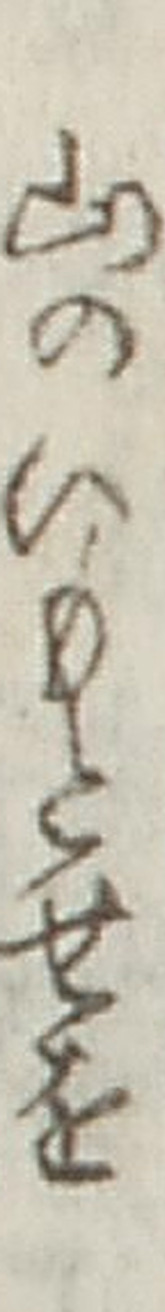山のいもとせを
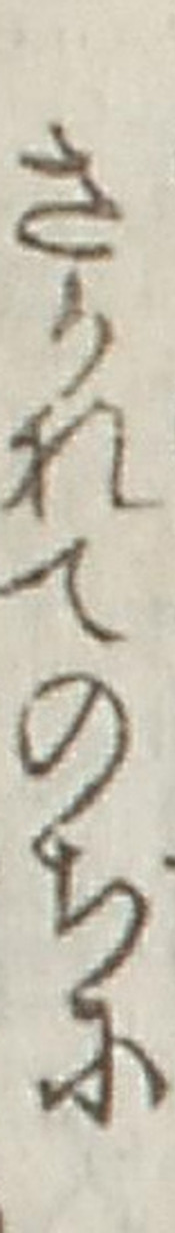さかれてのちに
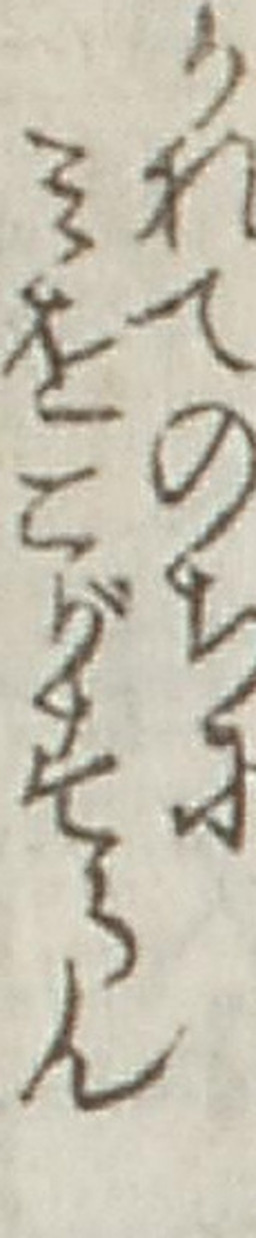みをこがすらん

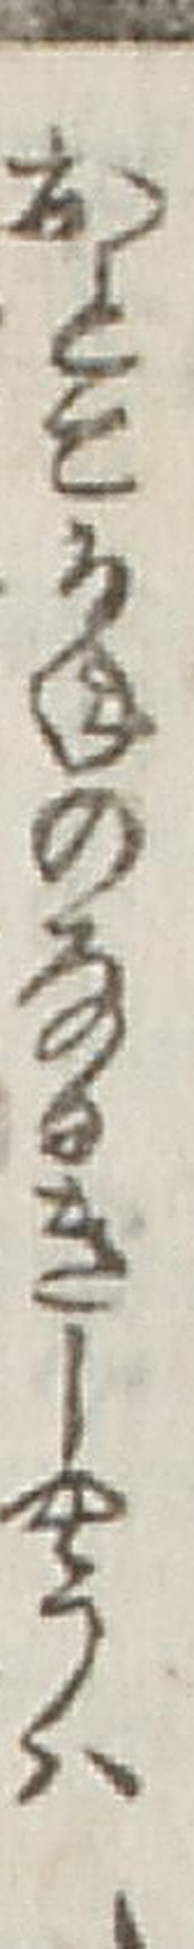おとこかねのなるきしやうは
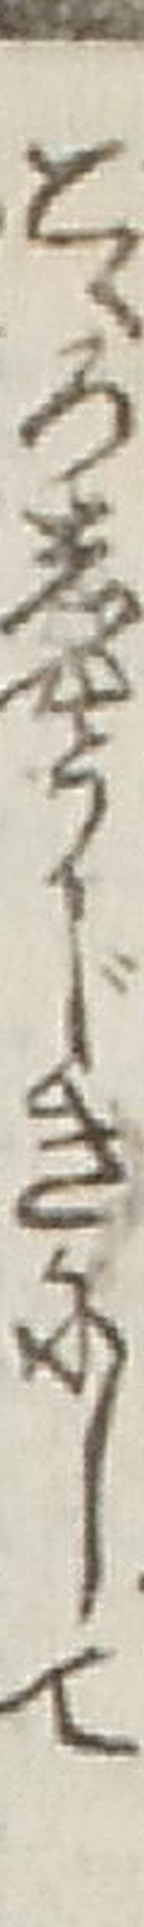こゝろしやうじきにして
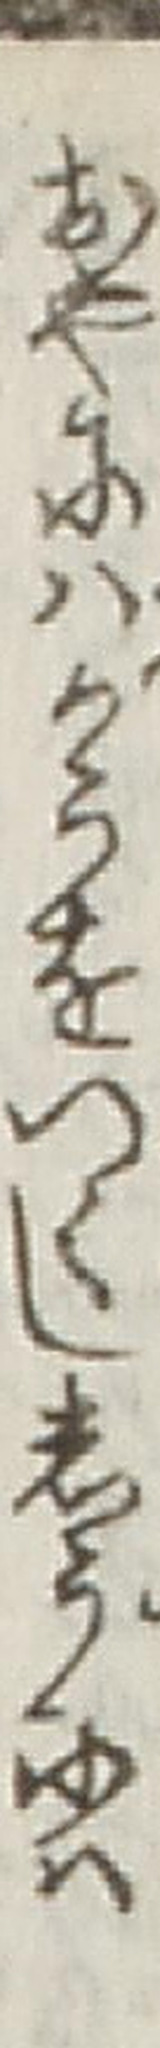おやにはかうをつくしふうふ
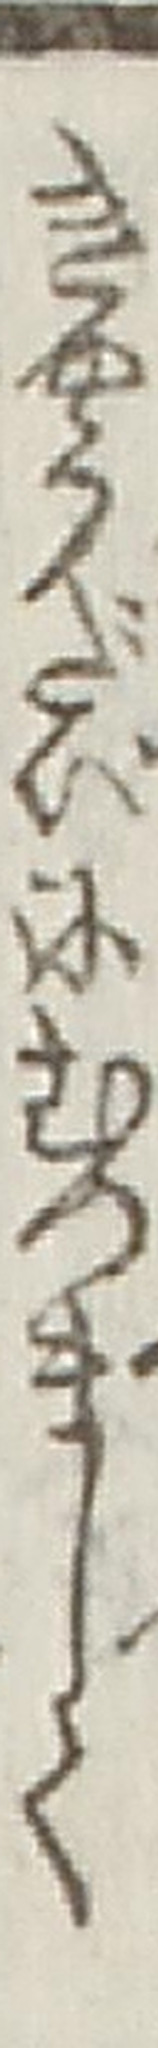きやうだいにむつましく
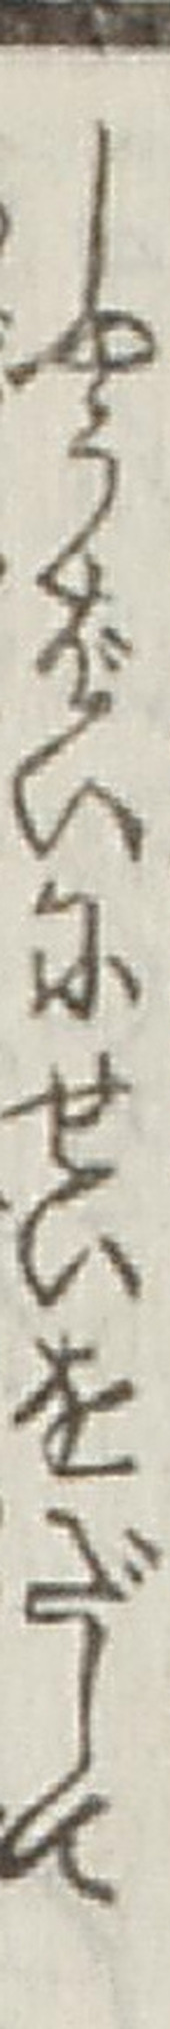しやうばいにせいをだして
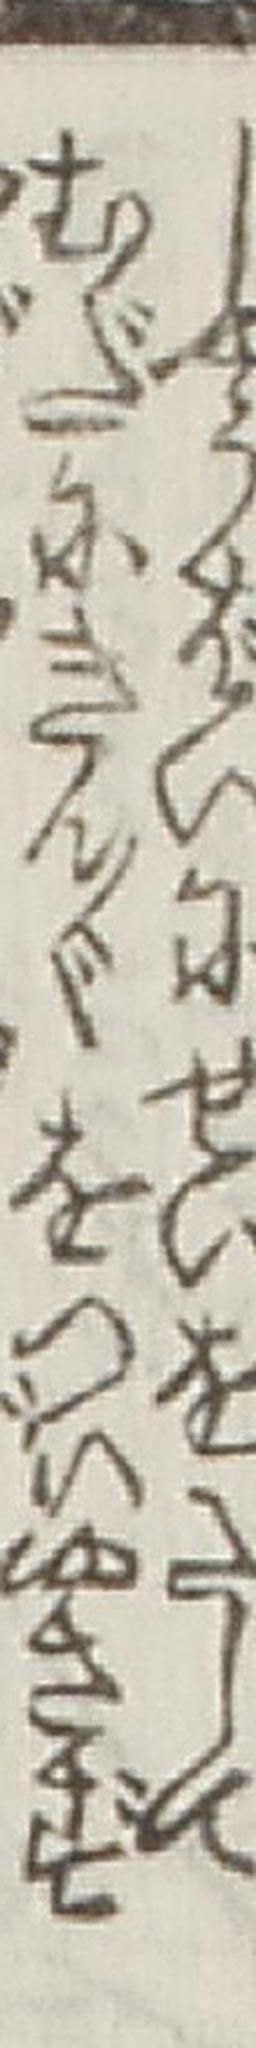むだにきん〴〵をついやさず
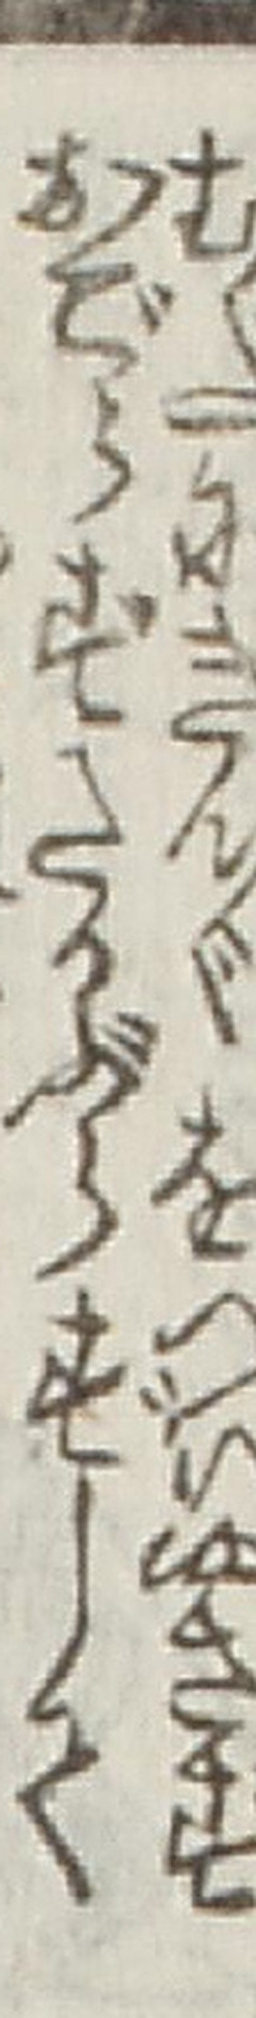おごらずたかぶらずして
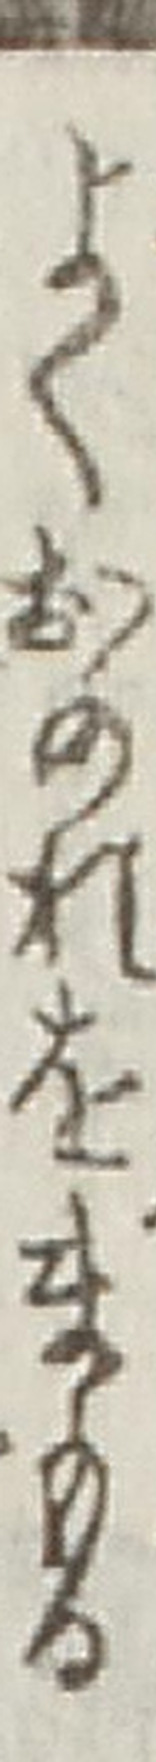よくおのれをまもる
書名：三世相出雲當座帳　上下冊
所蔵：東京大学地震研究所図書室 Earthquake Research Institute Library, The University of Tokyo, JAPAN
